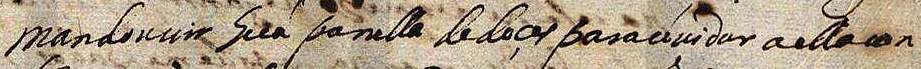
mandou uir huā panella de doçes para cōuidar a ella con
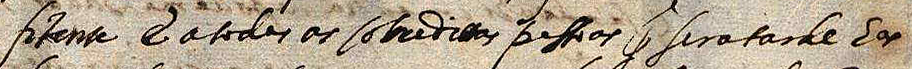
fitente e a todas as sobredittas pessoas pa ser a tarde E as
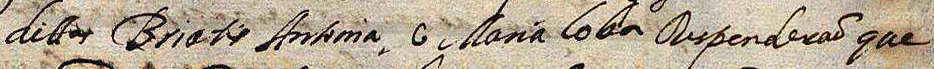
dittas Briatis Antonia, e Maria loba Responderaõ que
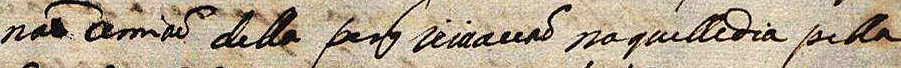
naõ comiaõ della porq̄ ieiuauaõ naquelle dia pella
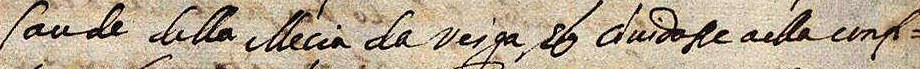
saude della Meçia da veiga, E q̄ cōuidasse a ella confi
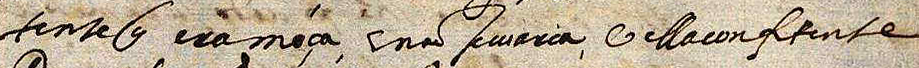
tente q̄ era moça, e não Jeiuaria, e ella confitente
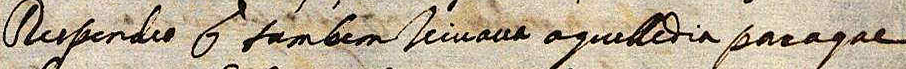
Respondeo q̄ tambem Jeiuaua aquelle dia para que
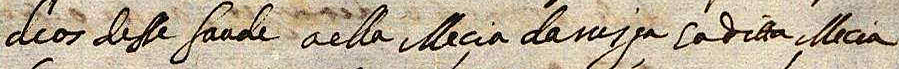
deos desse saude a ella Meçia da ueiga E a ditta Mecia
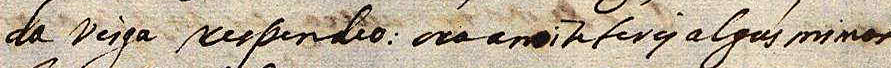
da veiga respondeo: ora a noite terej algūs mimos
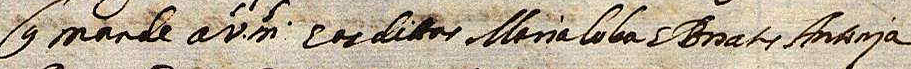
q̄ mande a vs. ms. E as dittas Maria loba E Briatis Antonja
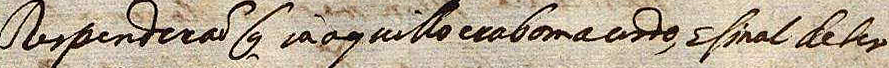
Responderaõ q̄ ia aquillo era bom acordo, E sinal de ter
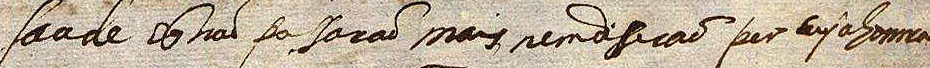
saude E q̄ naõ passaraõ mais nem disseraõ por cuja homra
